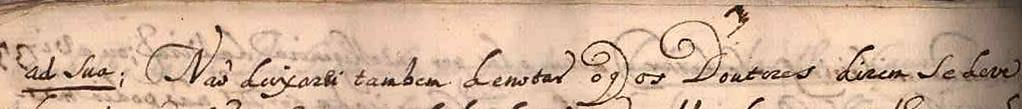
ad sua. Naõ deixarei tambem de notar o q̄ os Doutores dizem se deve
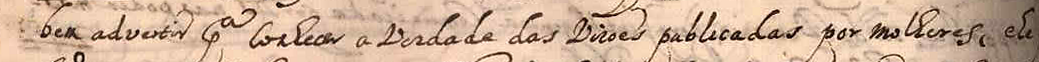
bem advertir pa conhecer a verdade das Vizoẽs publicadas por molheres, e he
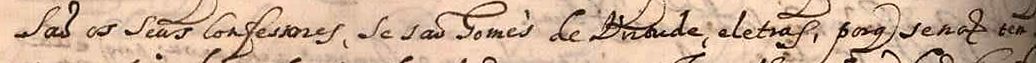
saõ os seus Confessores, se saõ homēs de Virtude, e letras, porq̄ se naõ tem
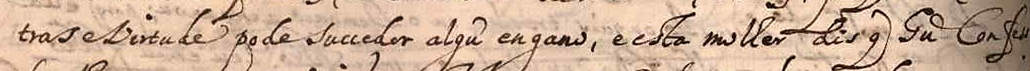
tras e Virtude pode succeder algū engano, e esta molher dis q̄ hū Confe
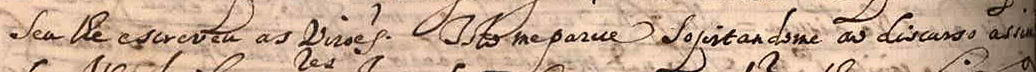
seu lhe escreveu as Vizoẽs. Isto me parece sojeitandome ao discurso assi
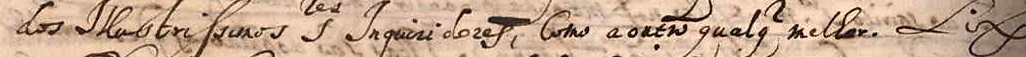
dos Illustrissimos S.res Inquizidores, Como a outro qualqr melhor. Lixa
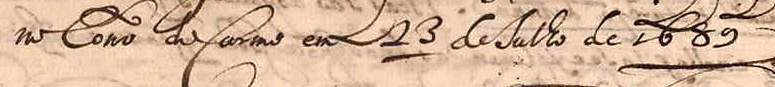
no Conv.to do Carmo em 23 de Iulho de 1689
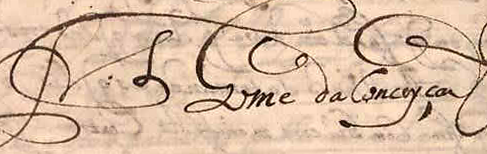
fr Thome da Conceyçaõ
